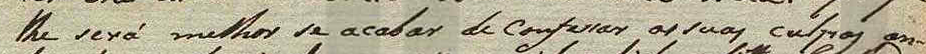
lhe será melhor se acabar de confessar as suas culpas an
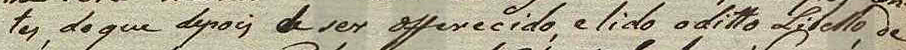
tes, do que depois de ser offerecido, e lido o ditto Libello, de
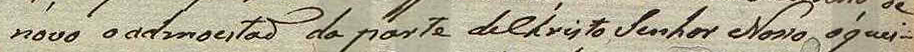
novo o admoestaõ da parte de Christo Senhor Nosso o quei
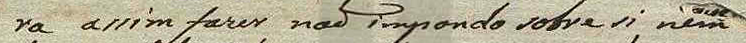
ra assim fazer, naõ impondo sobre si nem
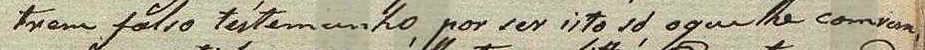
trem falso testemunho, por ser isto só, o que lhe comvem
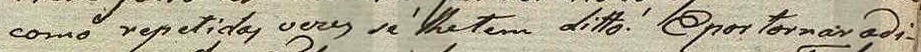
como repetidas vezes se lhe tem ditto. E por tornar a di
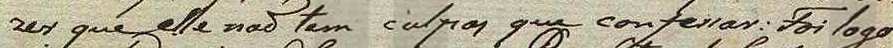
zer que elle naõ tem culpas que confessar: Foi logo
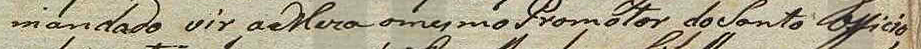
mandado vir a Meza o mesmo Promotor do Santo Officio,
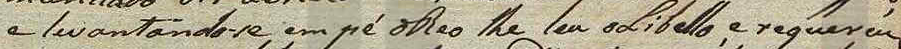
e levantando-se em pé o Reo lhe leu o Libello, e requereu
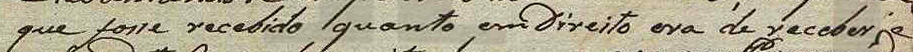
que fosse recebido quanto em Direito era de receber, e
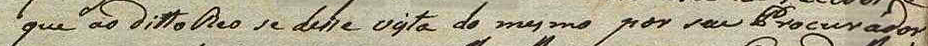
que ao ditto Reo se desse vista do mesmo por seu Procurador
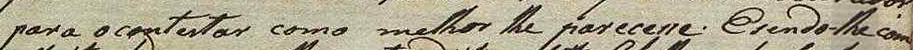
para o contestar como melhor lhe parecesse. E sendo-lhe com
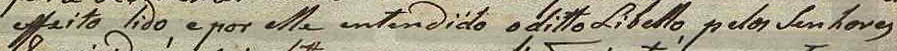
effeito lido, e por elle entendido o ditto Libello, pelos Senhores
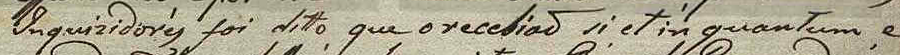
Inquizidores foi ditto, que o recebiaõ si et in quantum, e
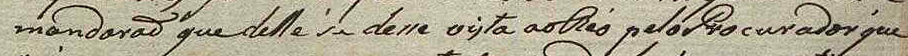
mandaraõ que delle se desse vista ao Réo pelo Procurador que
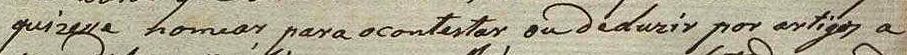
quizesse nomear, para o contestar, ou deduzir por artigos a
